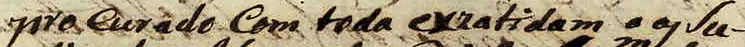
procurado com toda exzatidam e os Su
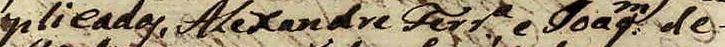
plicados, Alexandre Ferr.a e Joaq.m de
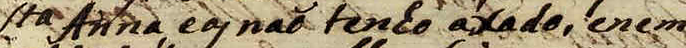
S.ta Anna e os que não tendo axado, e nem
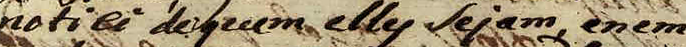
notici de quem elles sejam, e nem
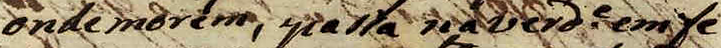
onde morem, passa se a verd.e em fé
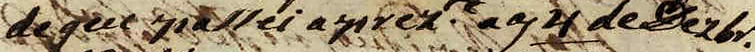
de que passei a prez.te aos 4 de Dezbr.o
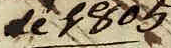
de 1805
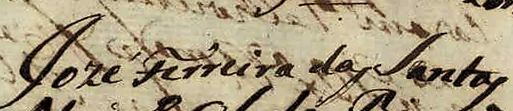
Jozé Ferreira dos Santos
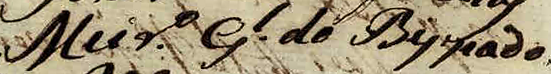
Meir.o G.l do Bispado
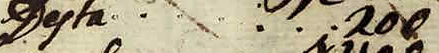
Desta 200
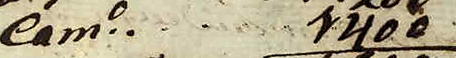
Cam.o 1400
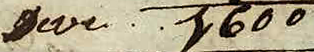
Deve1600
